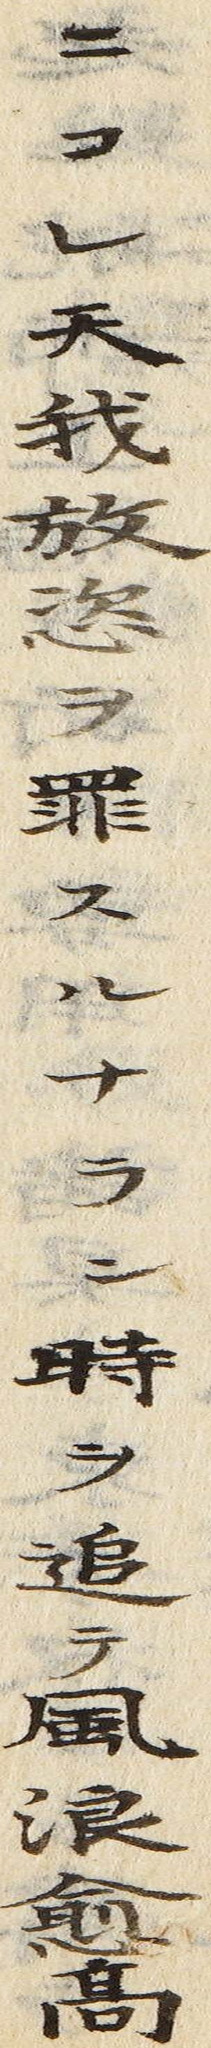ニコレ天我放恣ヲ罪スルナラン時ヲ追テ風浪愈高
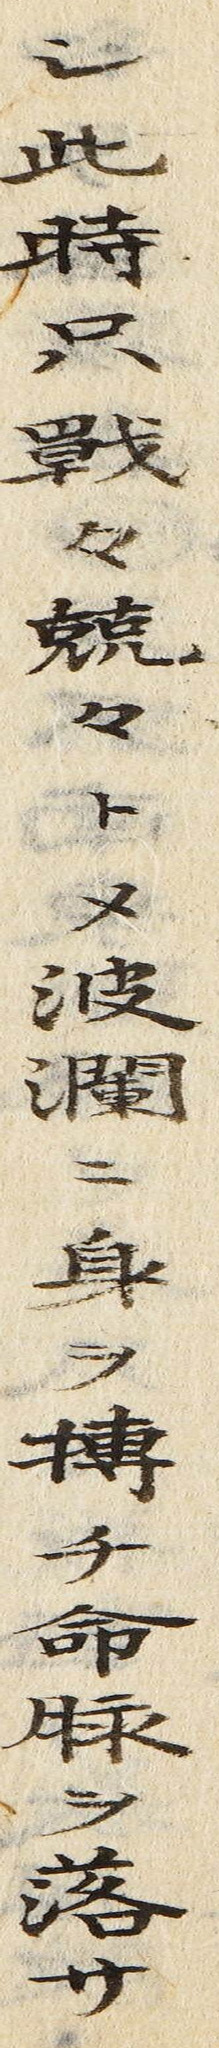シ此時只戦々兢々トシテ波瀾ニ身ヲ搏チ命脈ヲ落サ
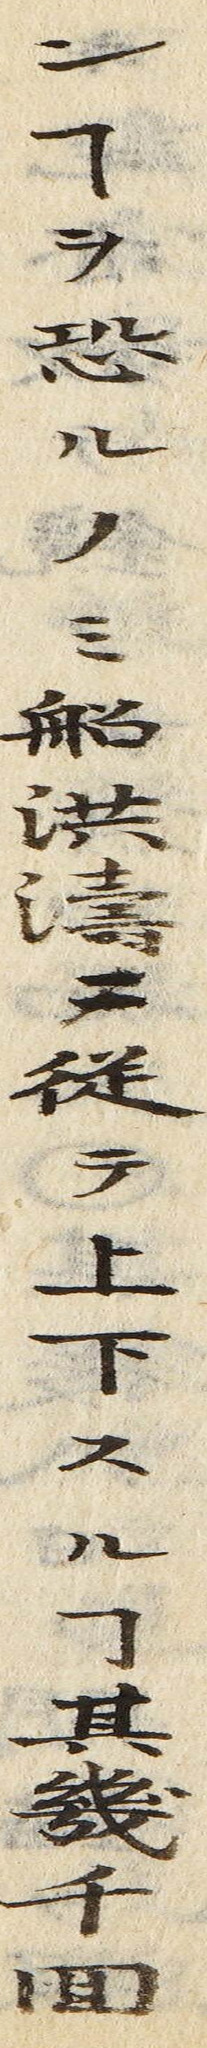ンコトヲ恐ルノミ船洪濤ニ従テ上下スルコト其幾千回
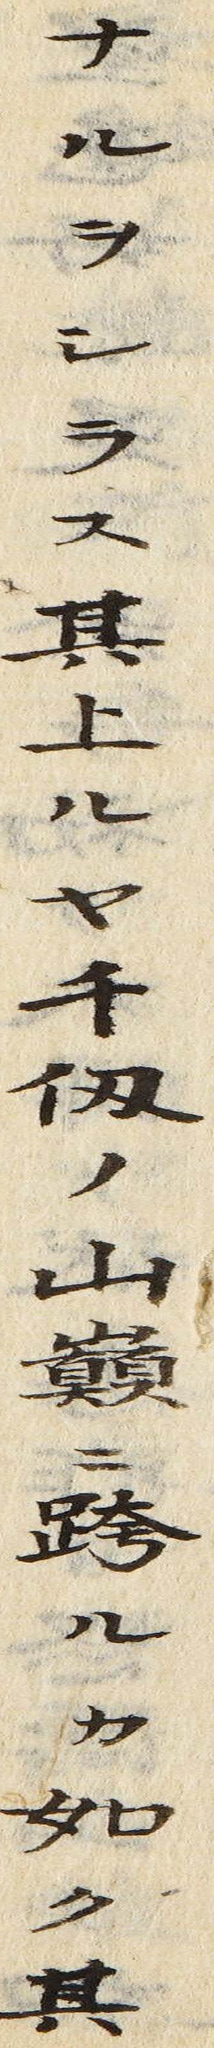ナルヲシラス其上ルヤ千仭ノ山嶺ニ跨ルカ如ク其
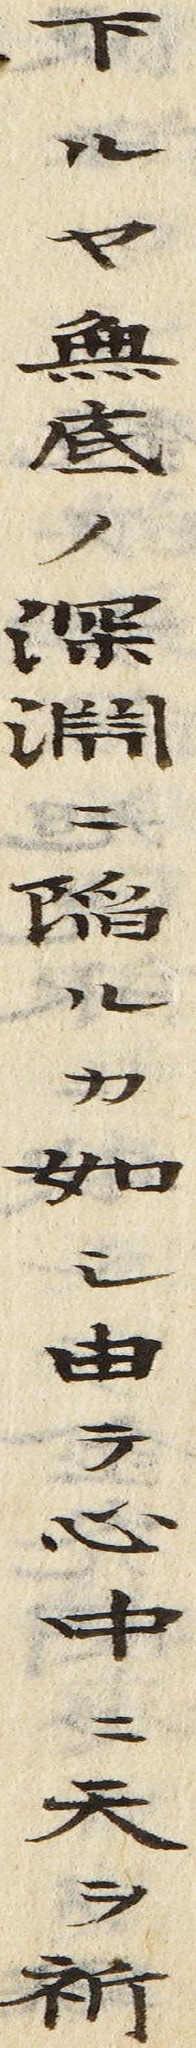下ルヤ無底ノ深淵ニ陥ルカ如シ由テ心中ニ天ヲ祈
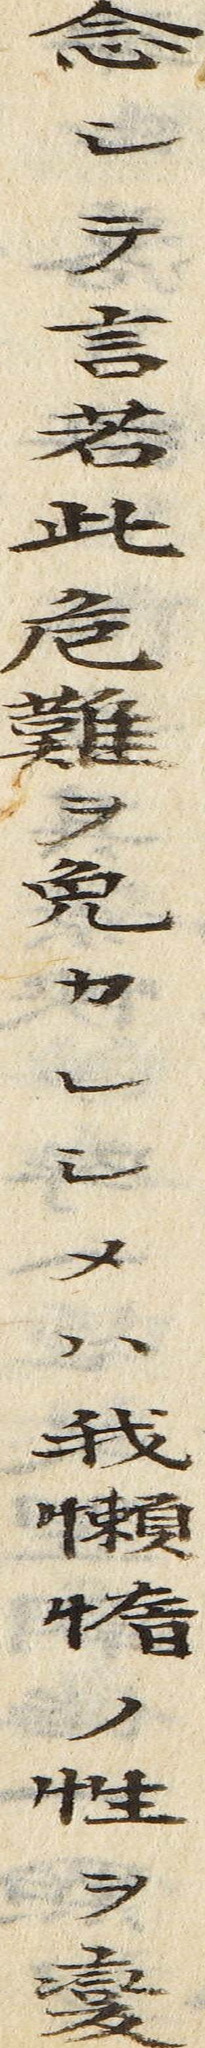念シテ言若此危難ヲ免カレシメハ我懶惰ノ性ヲ変
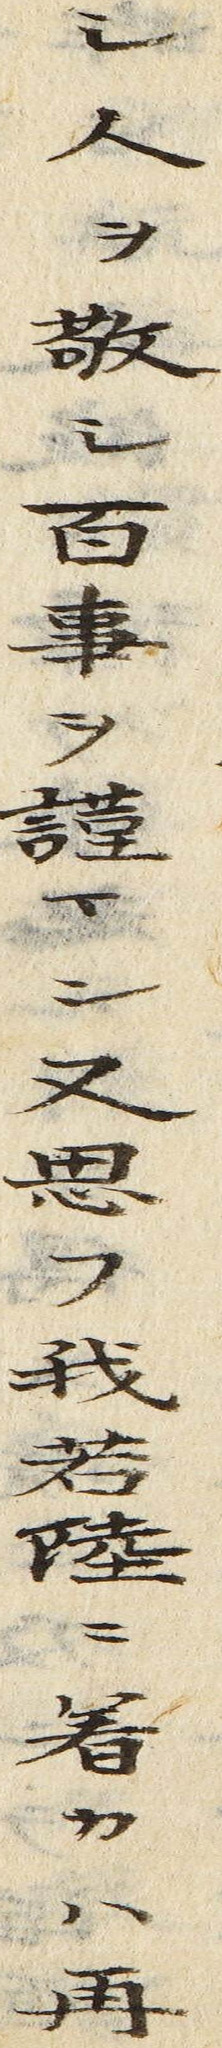シ人ヲ敬シ百事ヲ謹マン又思フ我若陸ニ着カハ再
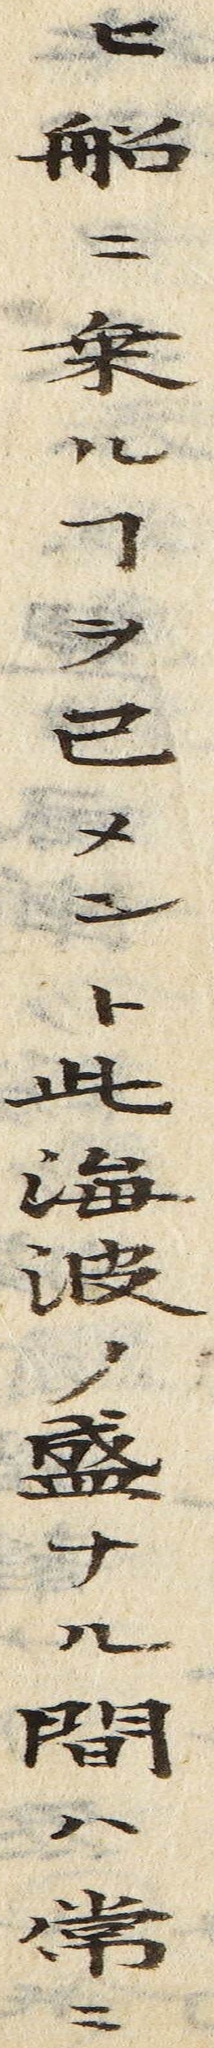ヒ船ニ乗ルコトヲ已メント此海波ノ盛ナル間ハ常ニ

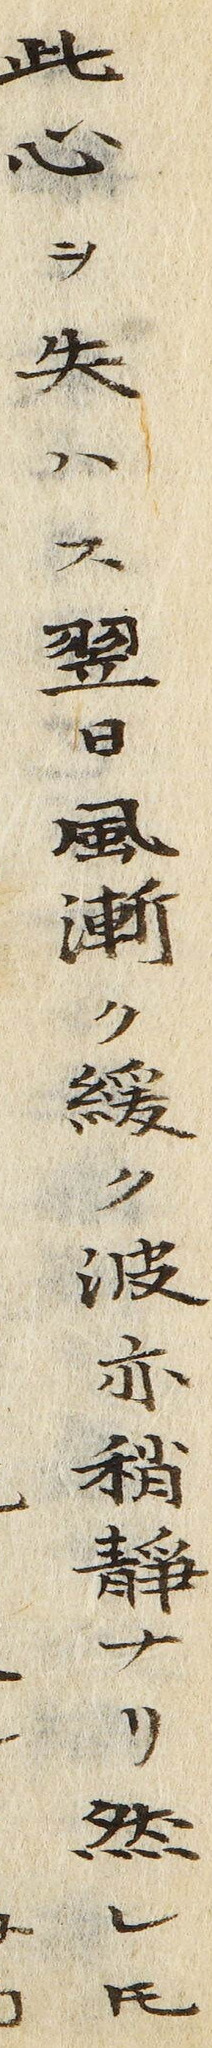此心ヲ失ハス翌日風漸ク緩ク波亦稍静ナリ然レトモ
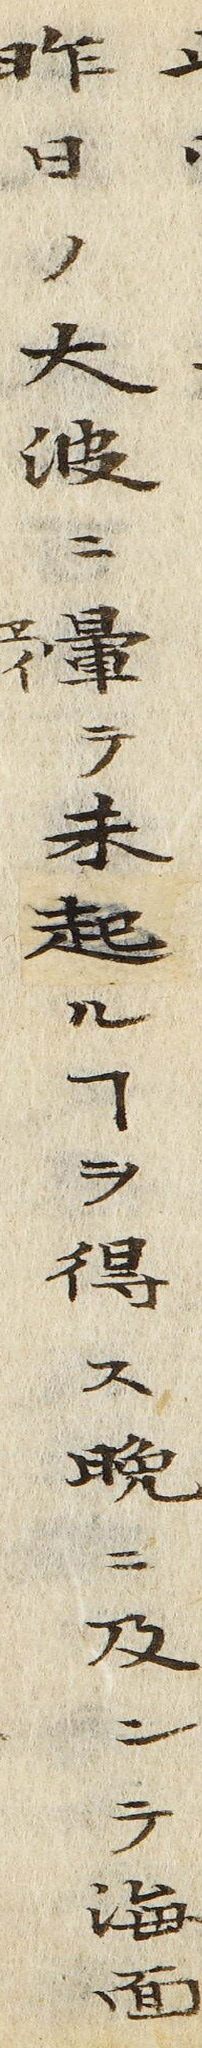昨日ノ大波ニ暈テ未起ルコトヲ得ス晩ニ及ンテ海面
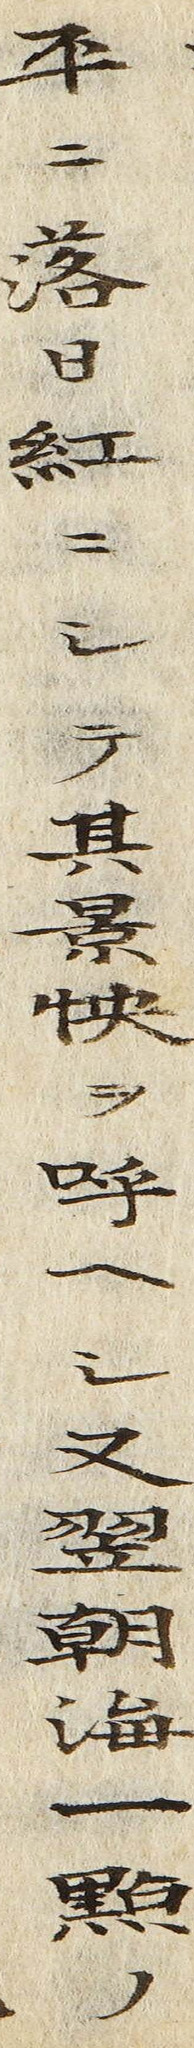平ニ落日紅ニシテ景怏ヲ呼ヘシ又翌朝海一点ノ
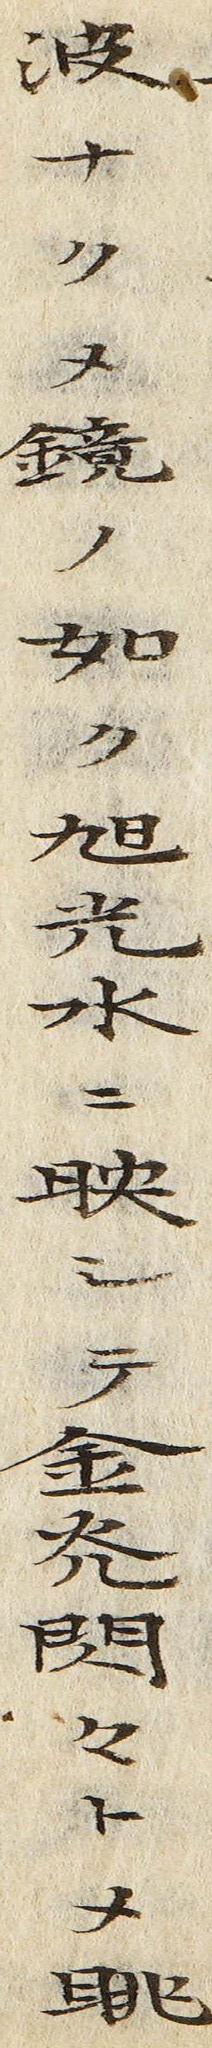波ナクシテ鏡ノ如ク旭光水ニ映シテ金灮閃々トシテ眺
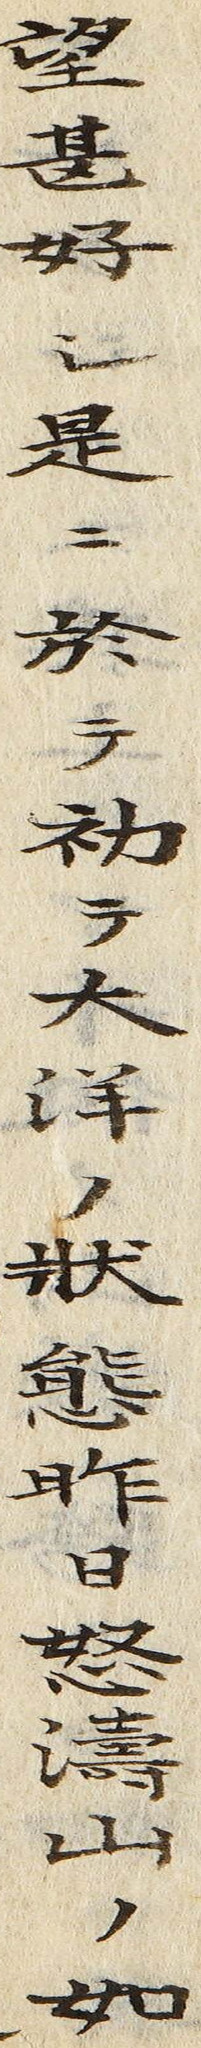望甚良シ是ニ於テ初テ大洋ノ状態昨日怒濤山ノ如
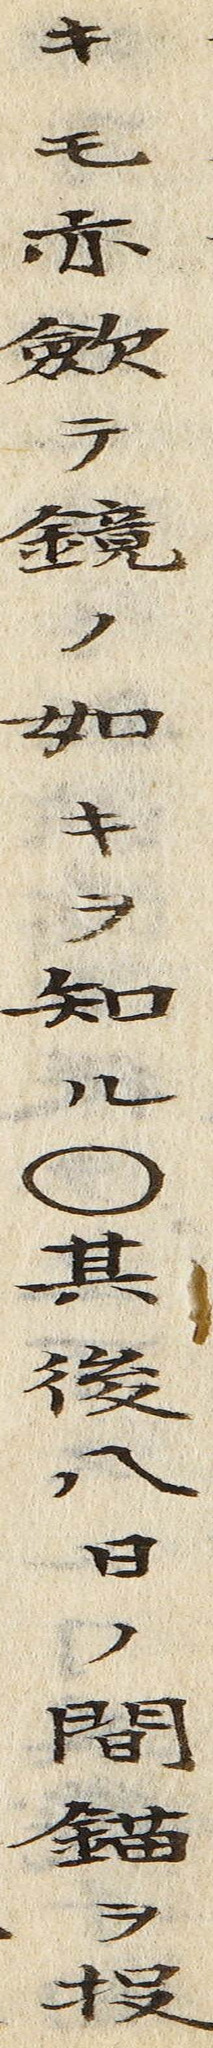キモ亦斂テ鏡ノ如キヲ知ル○其後八日ノ間錨ヲ投
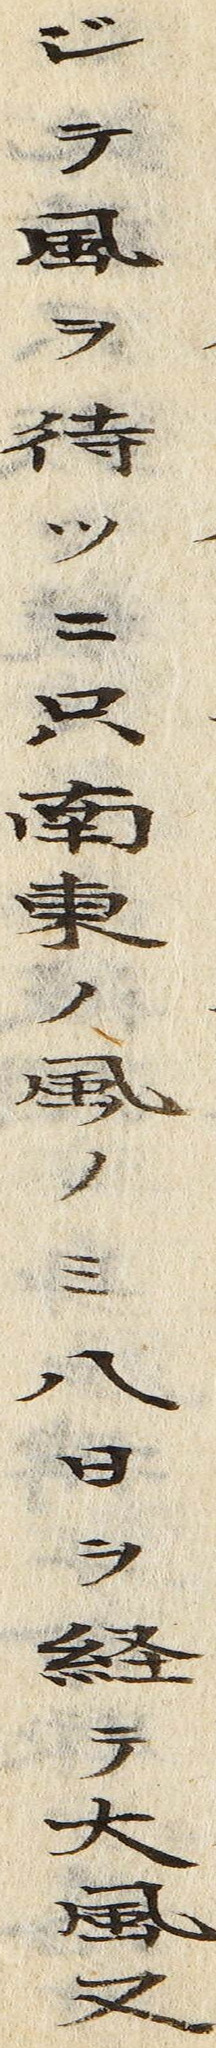ジテ風ヲ待ツニ只南東ノ風ノミ八日ヲ経テ大風又
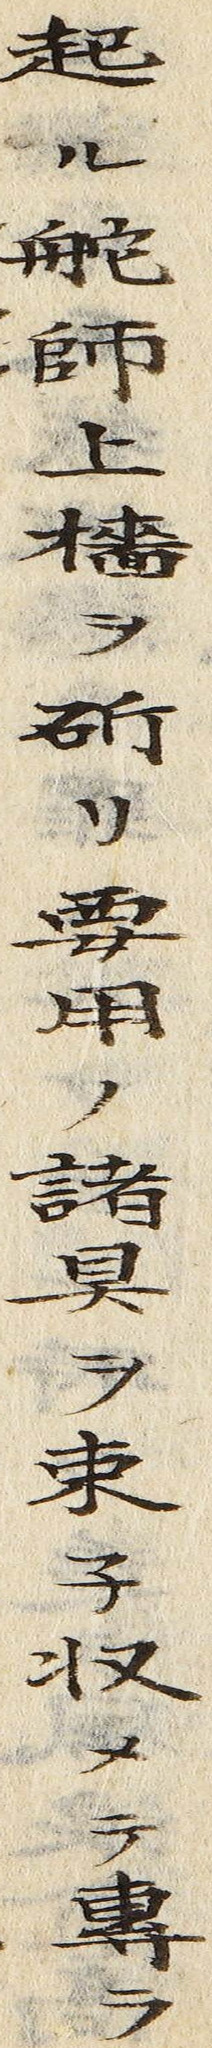起ル舵師上檣ヲ斫リ要用ノ諸具ヲ束ネ収メテ専ラ
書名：漂流紀事
